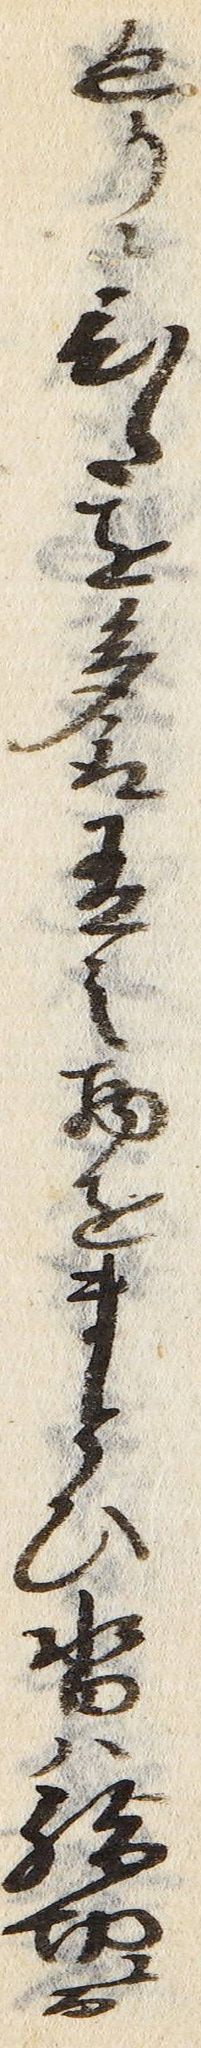廻りニひたを多取有之物をまとひ沓ハ絹切ニ而
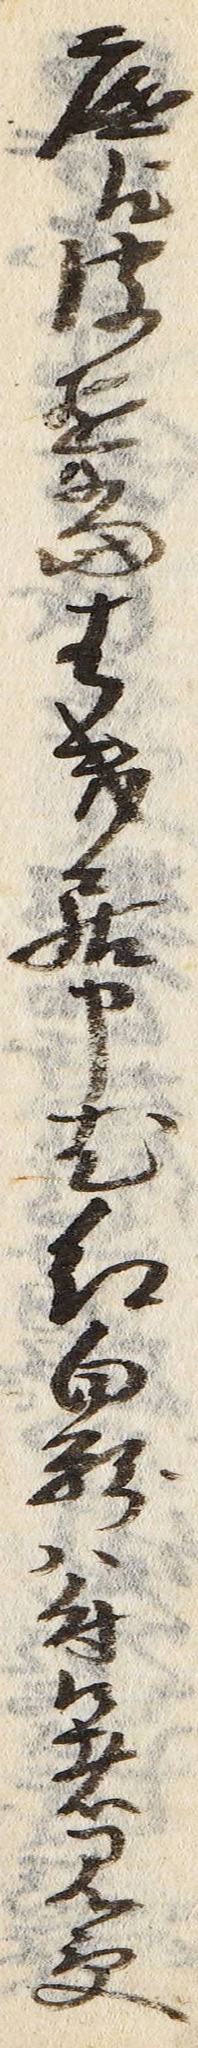底江皮を當はき居申尤紅白粉ハ付候者見受
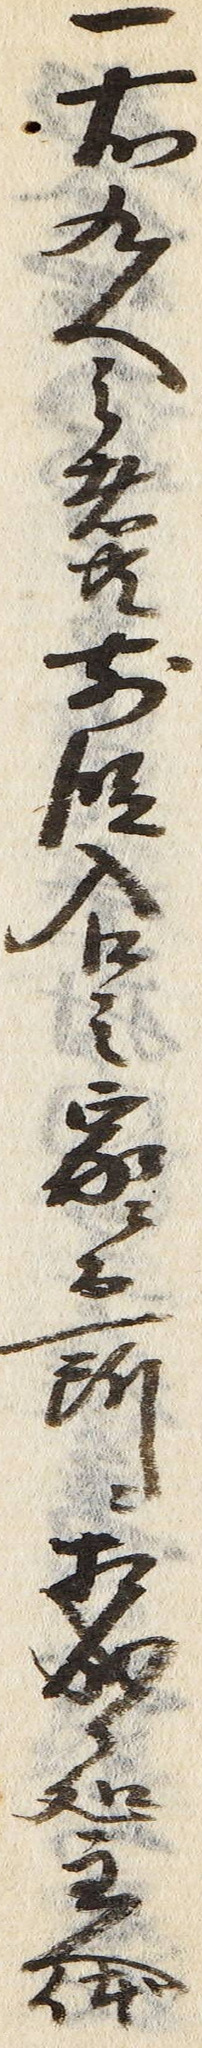一右九人之者共前段入口之家ニ而一所ニ相成候処主人体
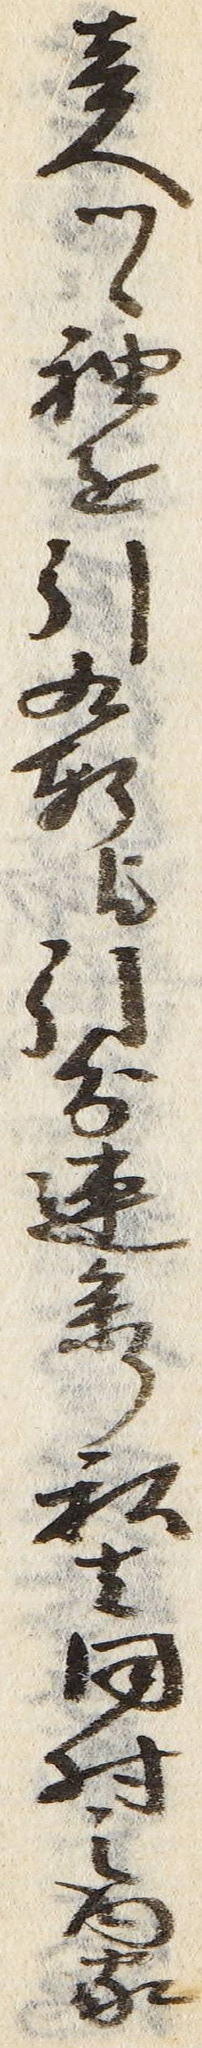壱人ツヽ袖を引九軒江引分連参り私者同村之内家
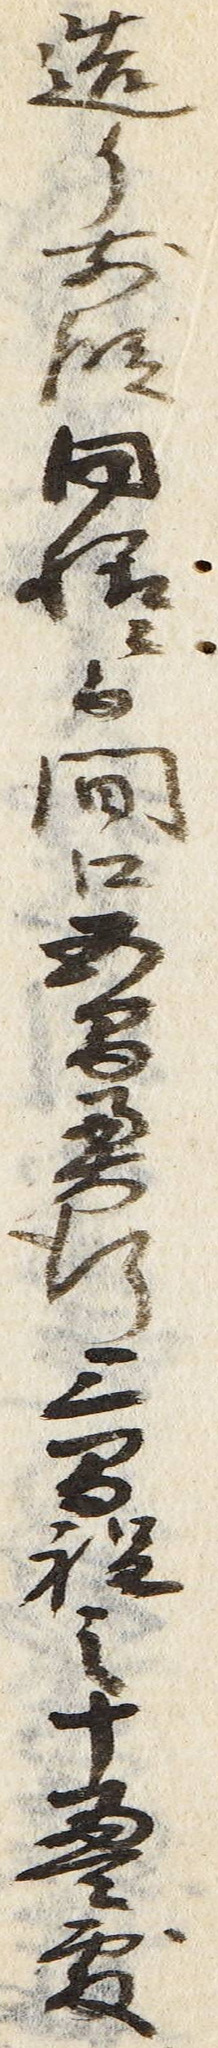造り前段同様ニ而間口五間奥行三間程之十畳敷
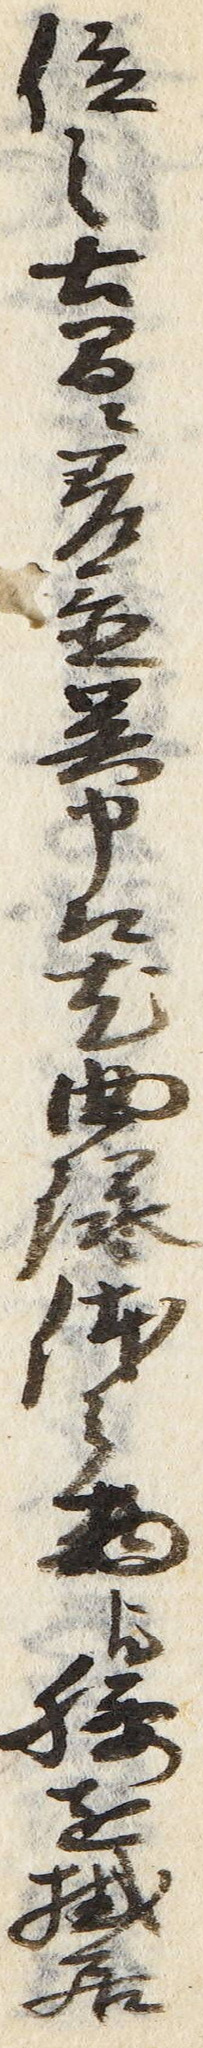位之土間ニ差置呉申候尤曲禄体之物江腰を掛居
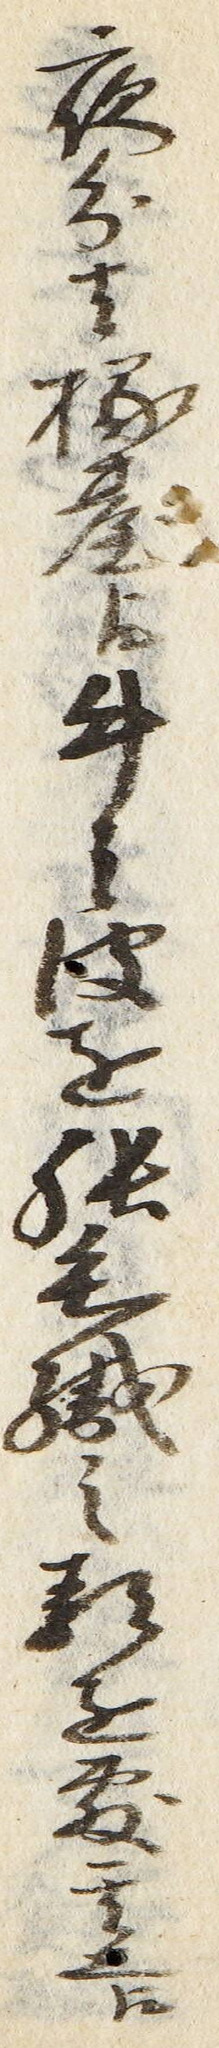夜分者椽臺江牛之皮を張毛織之類を敷其上江
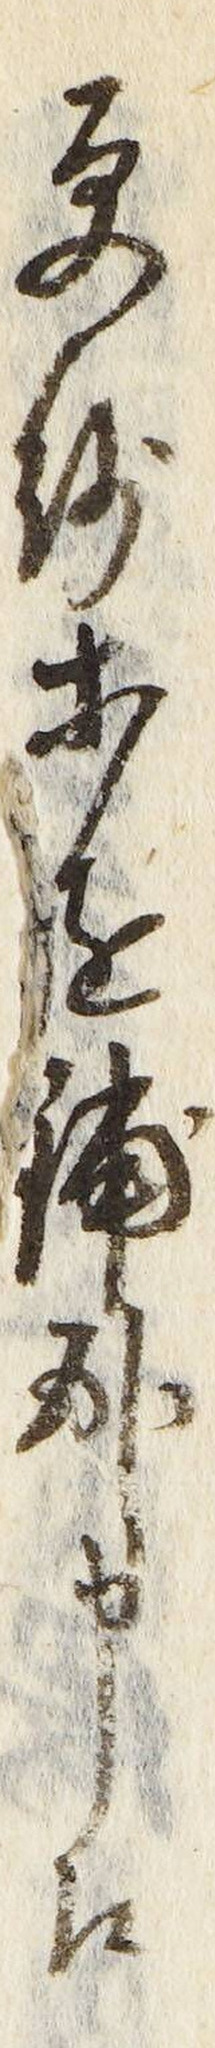更紗等を舗臥申候
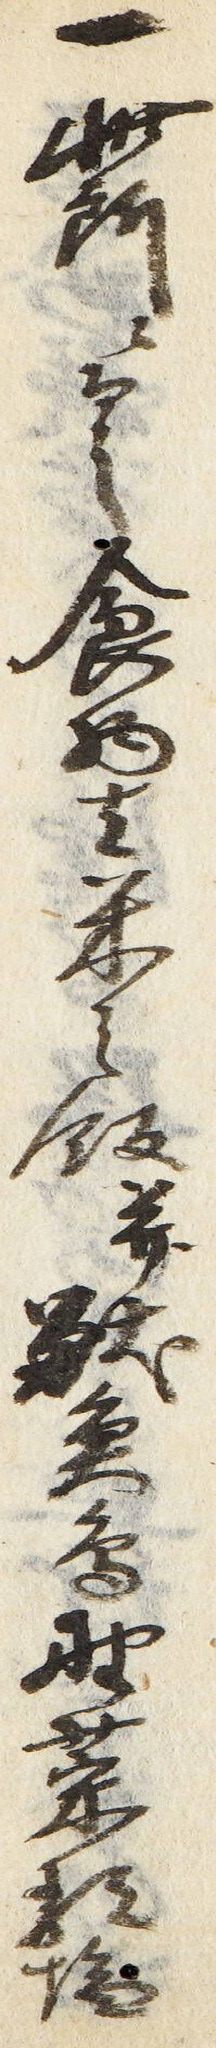一此所ニ而之食物者米之飯幷獣𩵋鳥野菜類塩

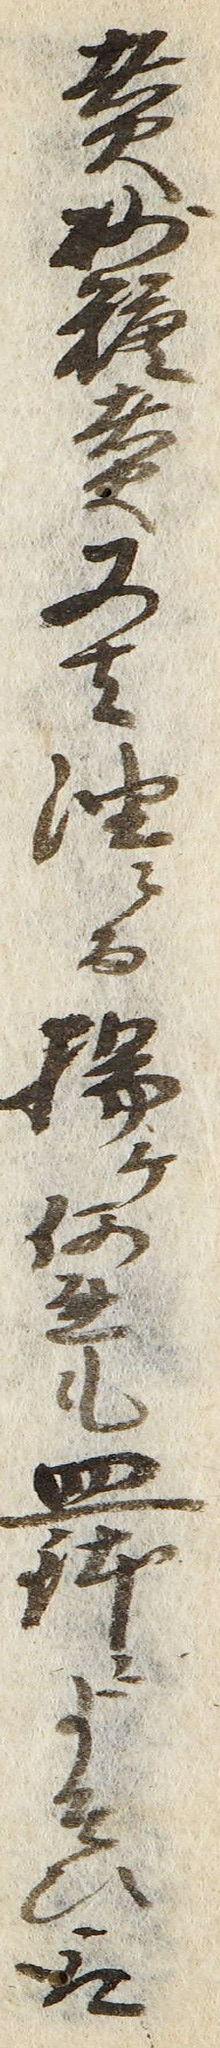煑砂糖煑又者油ニ而揚ケ何れも皿躰ニよそひ取
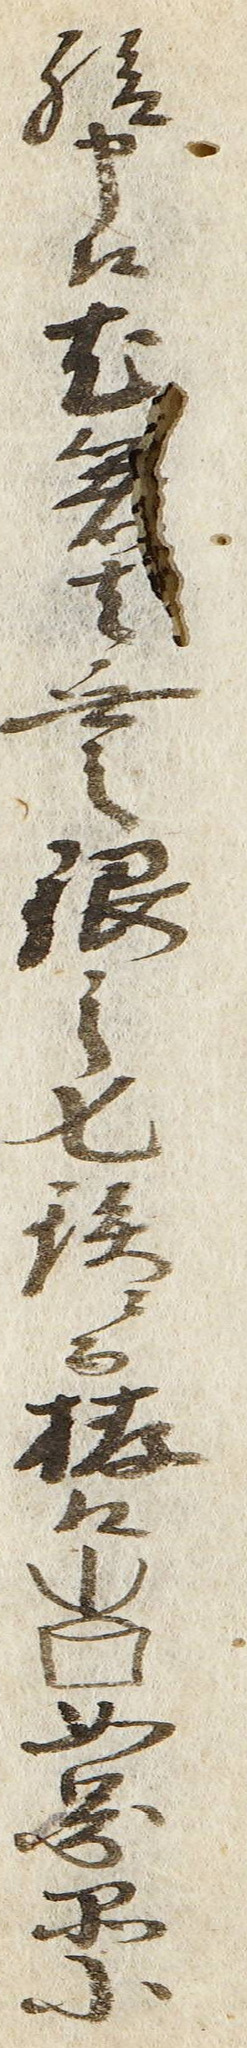給申候尤箸者無之銀之匕鉄ニ而拵候如圖品に
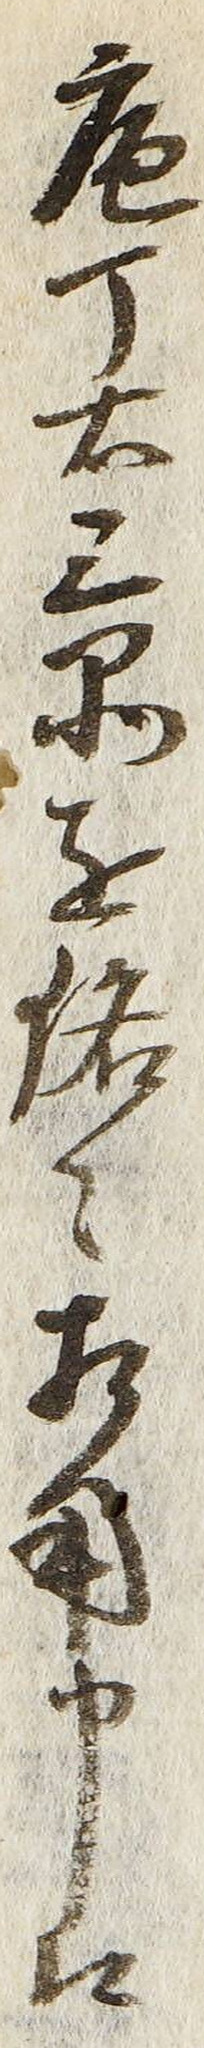包丁右三品を銘々相用申候
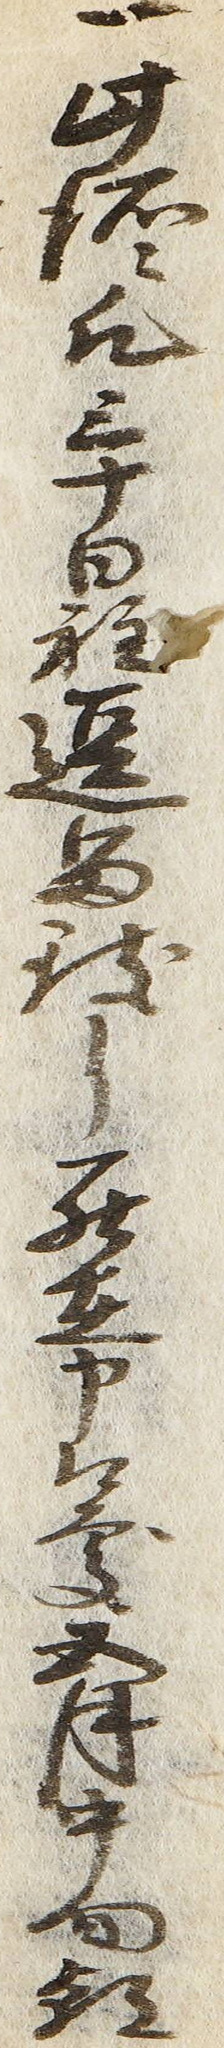一此所ニ凡三十日程逗留致し罷在申候處五月中旬朝
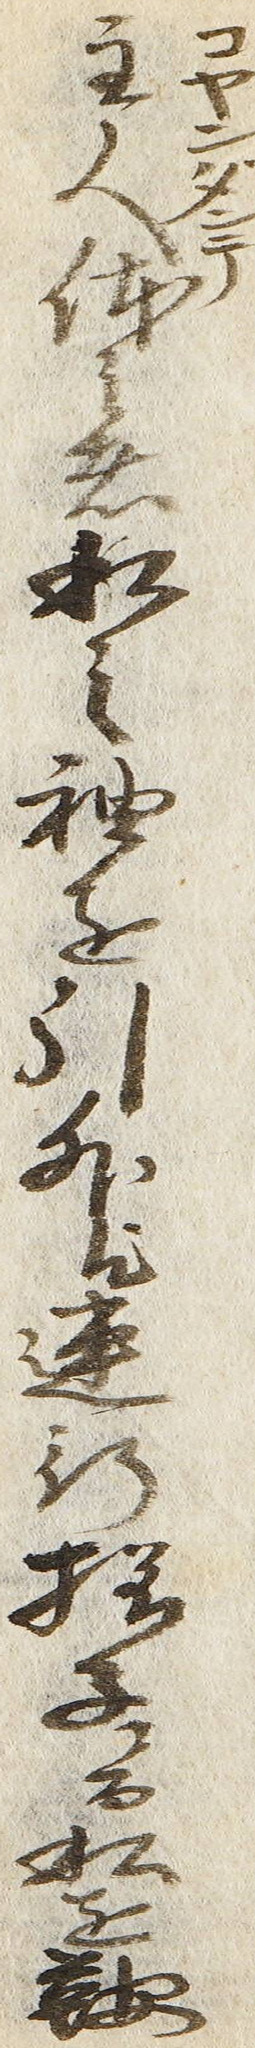主人体之者私之袖を引外江連行様子ニ而私を鞍
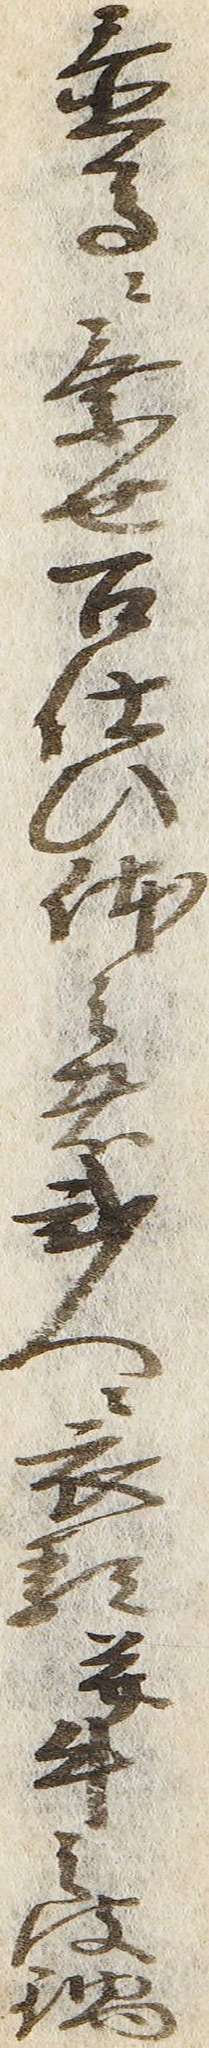置馬ニ乗せ召仕ひ体之弐人ニ衣類幷牛之皮鍋
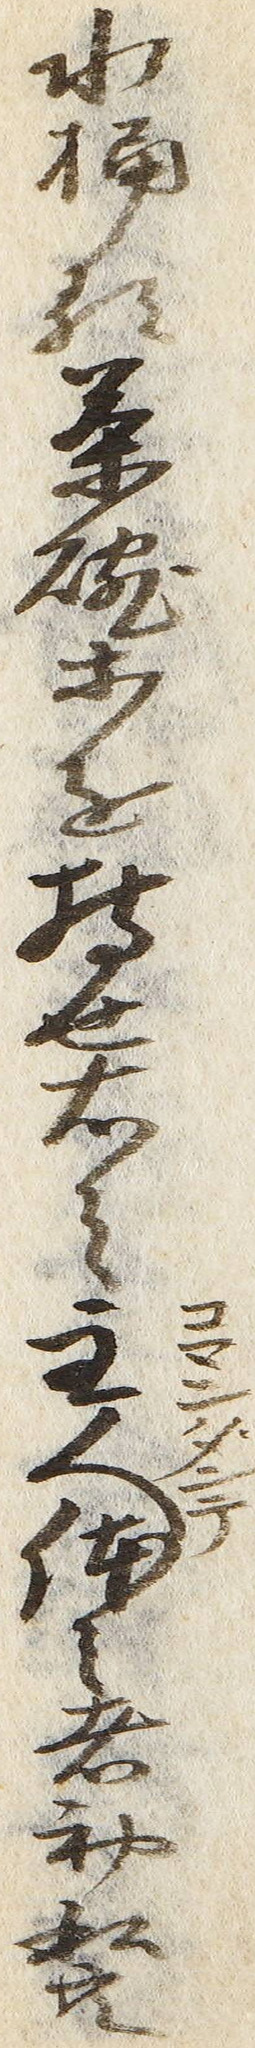水桶之類茶碗等を持せ右之主人体之者初私共
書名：漂流人善助聞書
